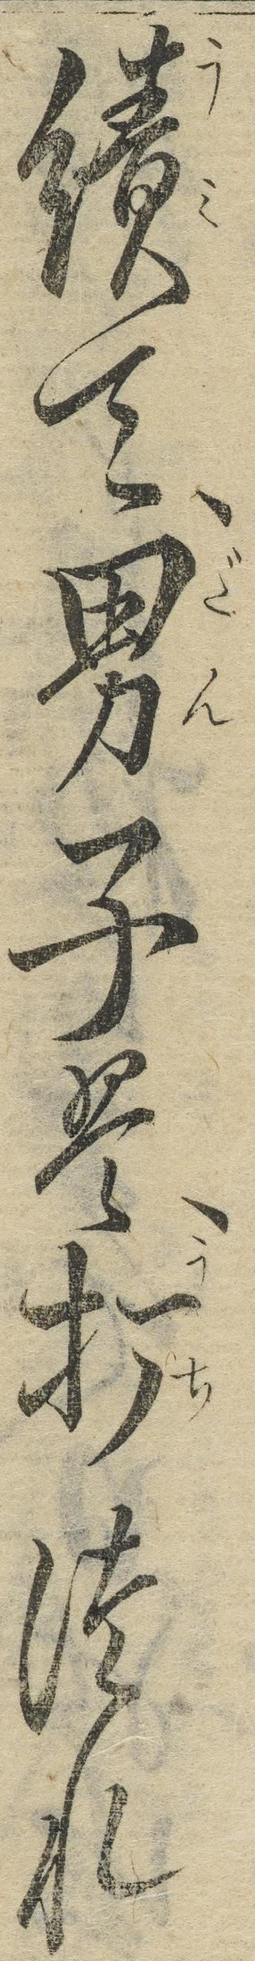績て、男子は打つれ
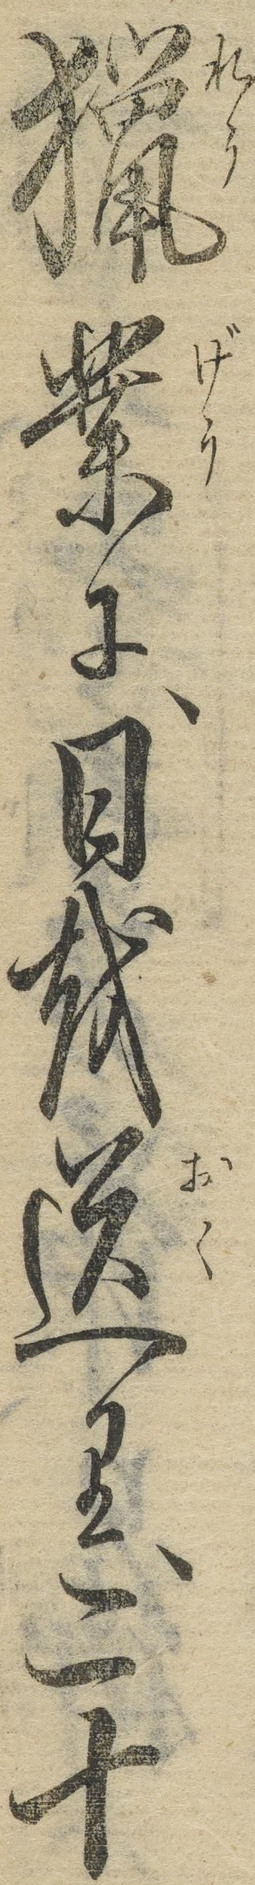猟業に、日を送り、二十

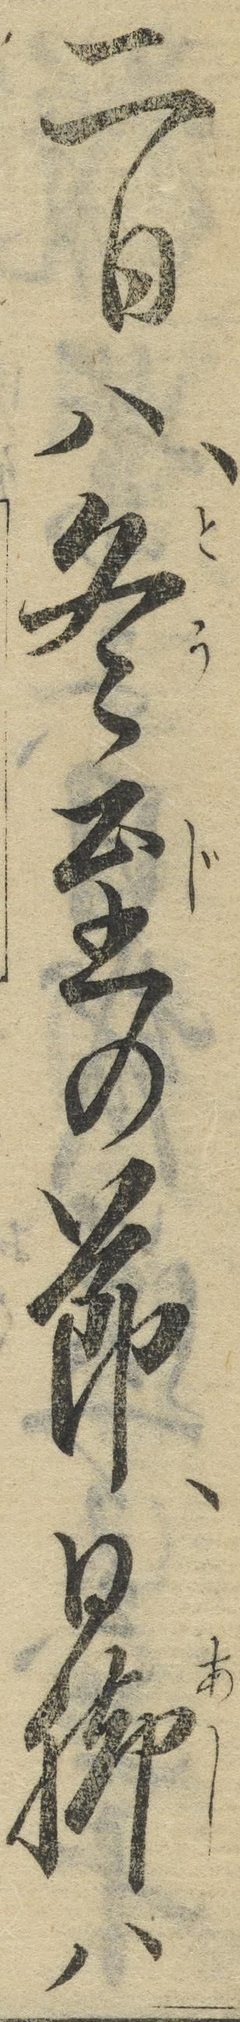二日は、冬至の節、日脚は
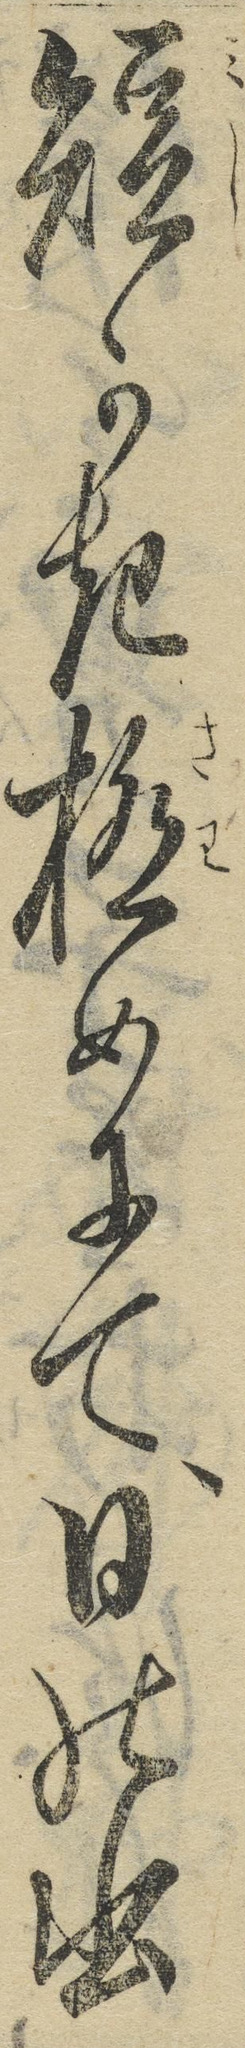短かき極めにて、日の出
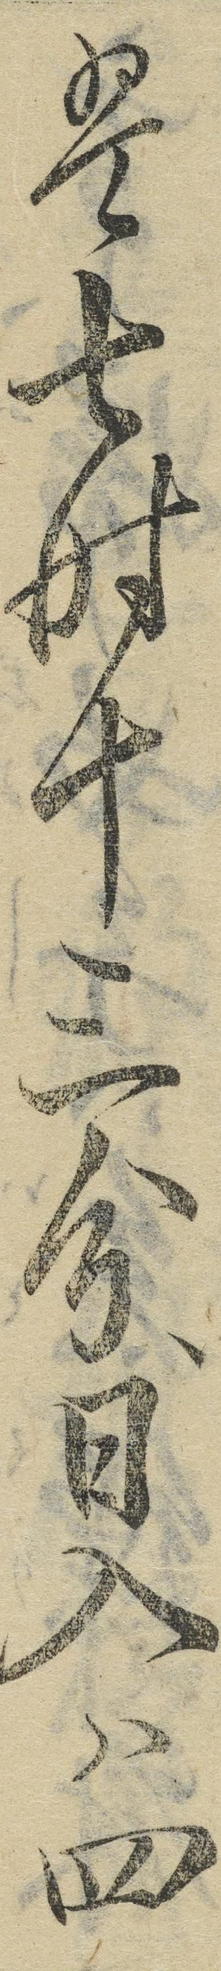は七時十三分、日入は四
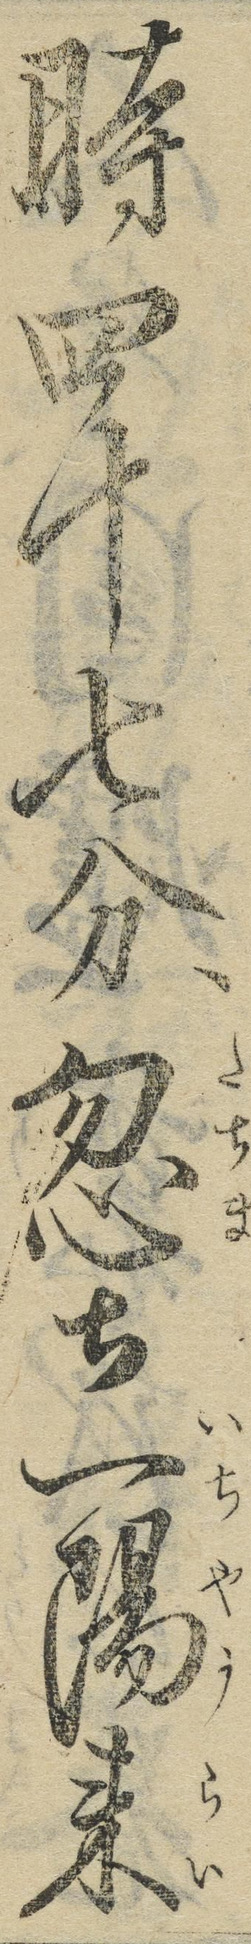時四十七分、忽ち一陽来
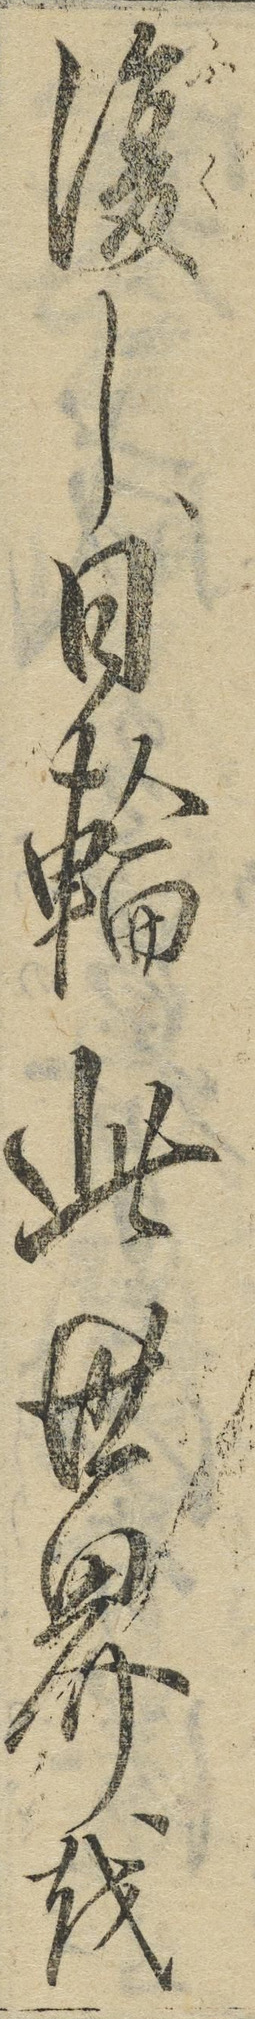復し、日輪此世界を
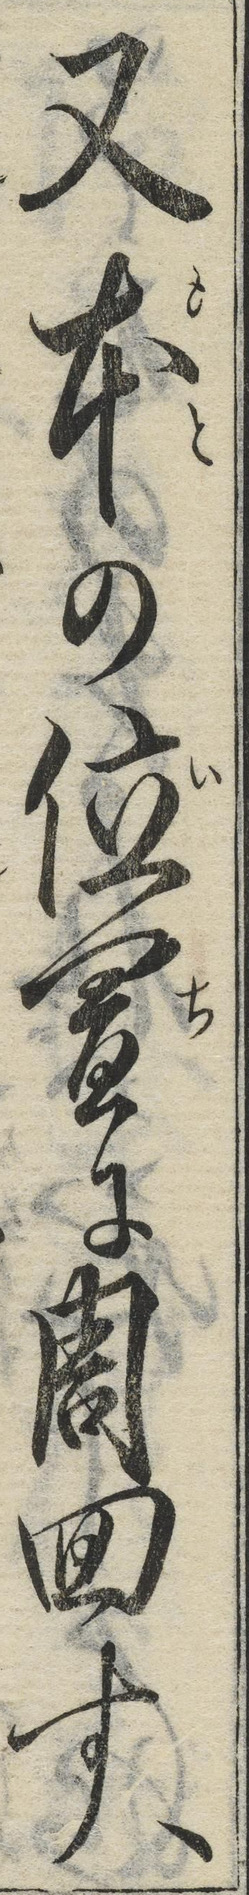又本の位置に周回す、
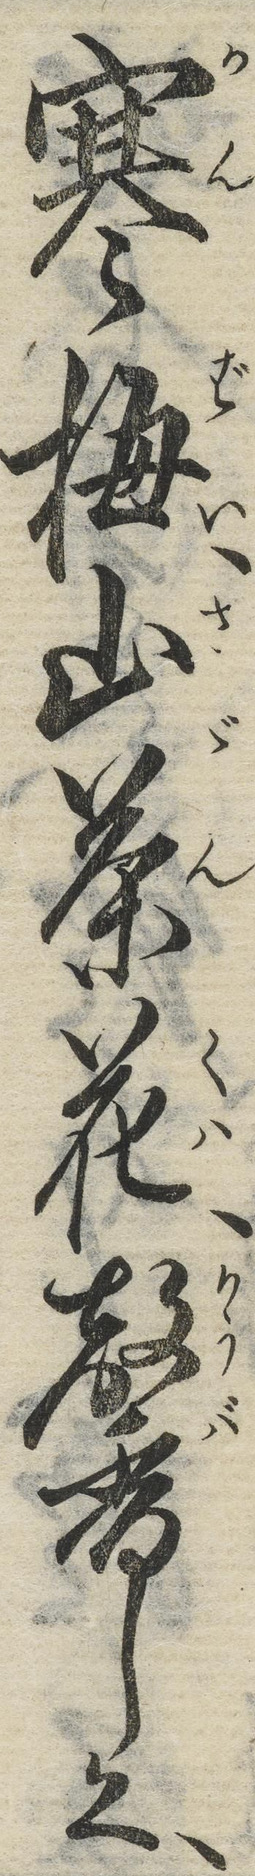寒梅、山茶花、馨しく、
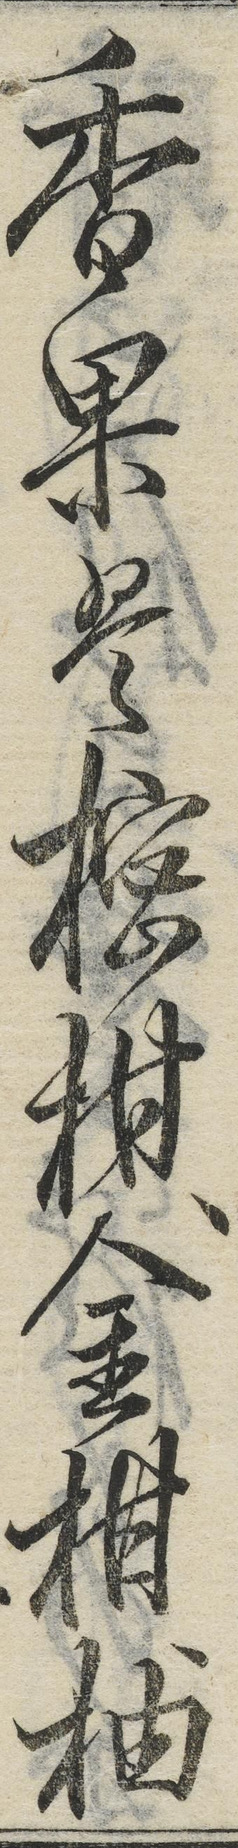香果は蜜柑、金柑、柚
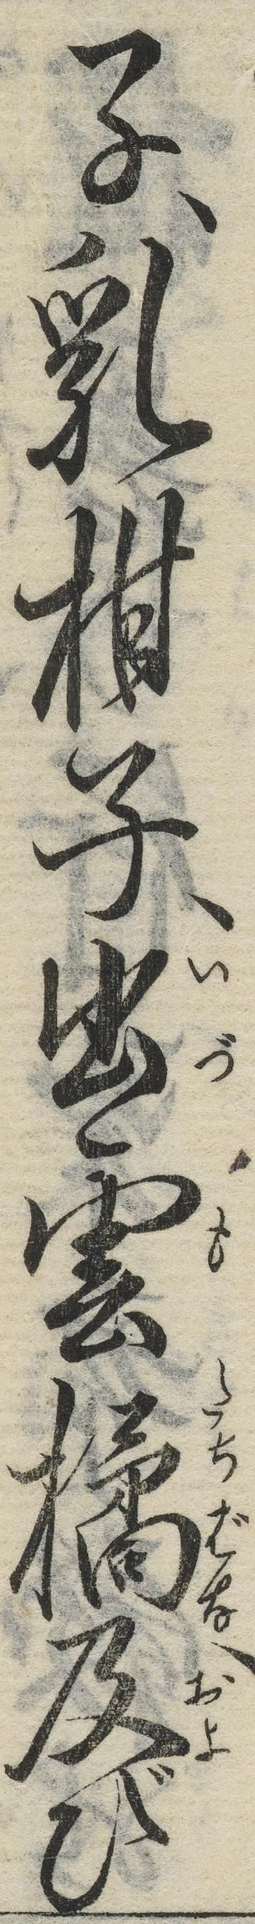子、乳柑子、出雲橘、及び
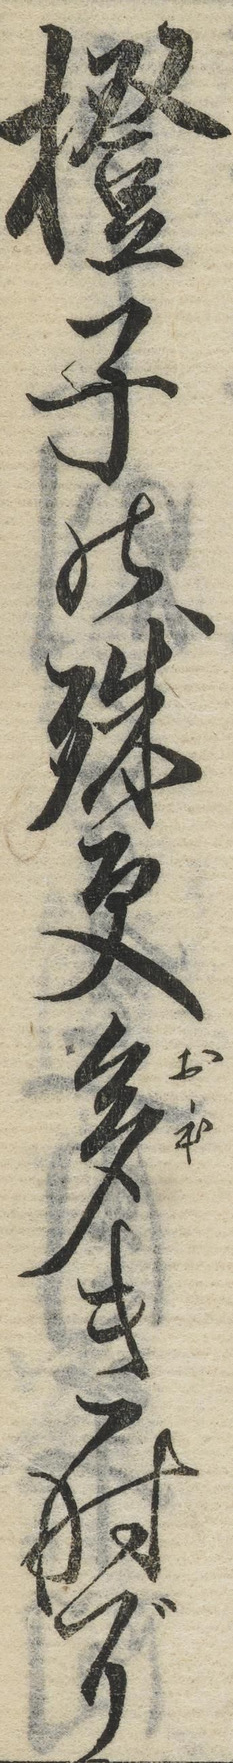橙子の、殊更多き時ぞ

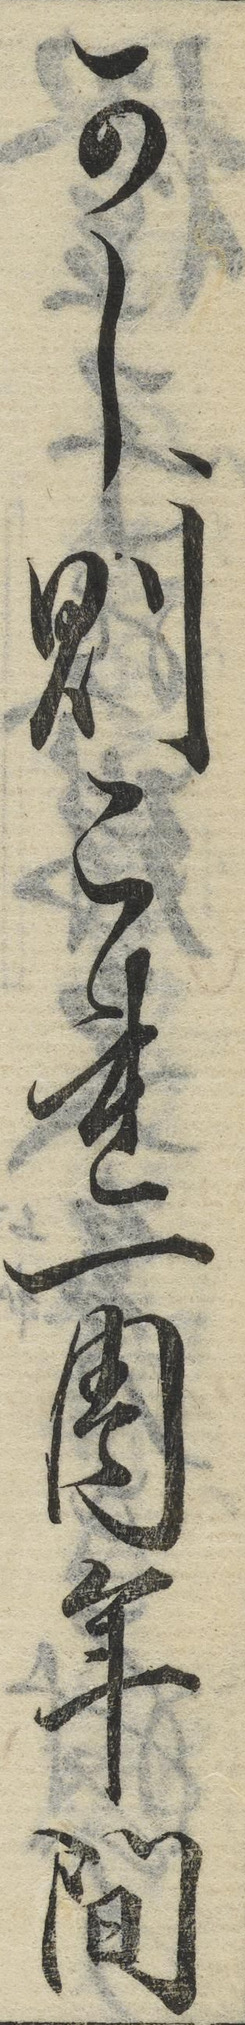かし、則これ一周年間
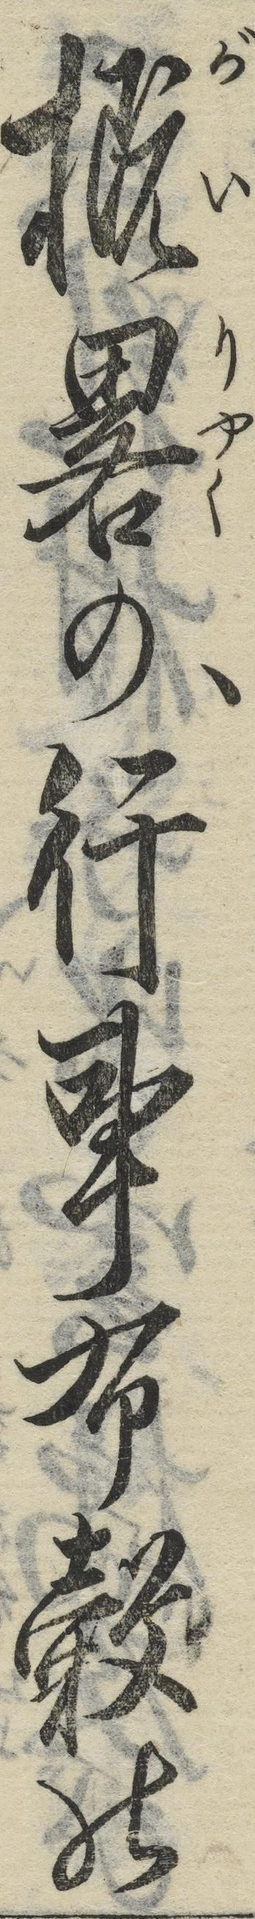概略の、行事布穀の
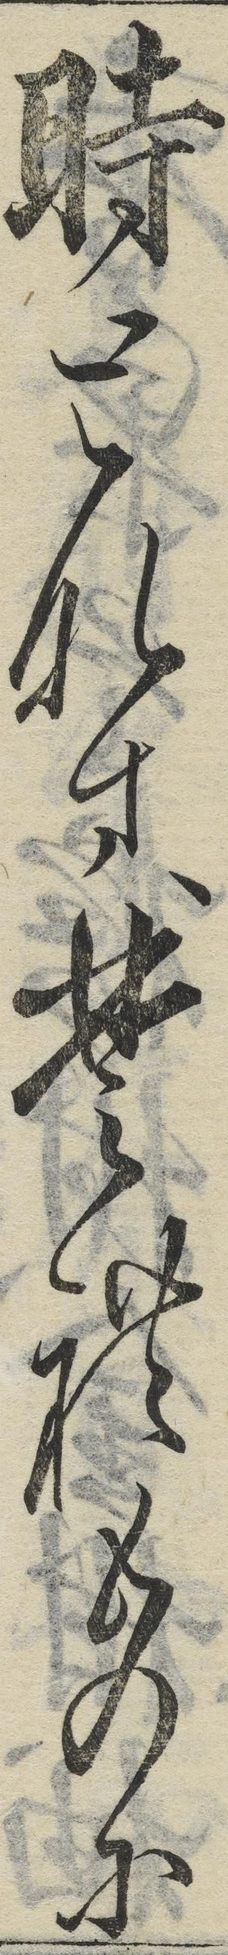時となす、それものに
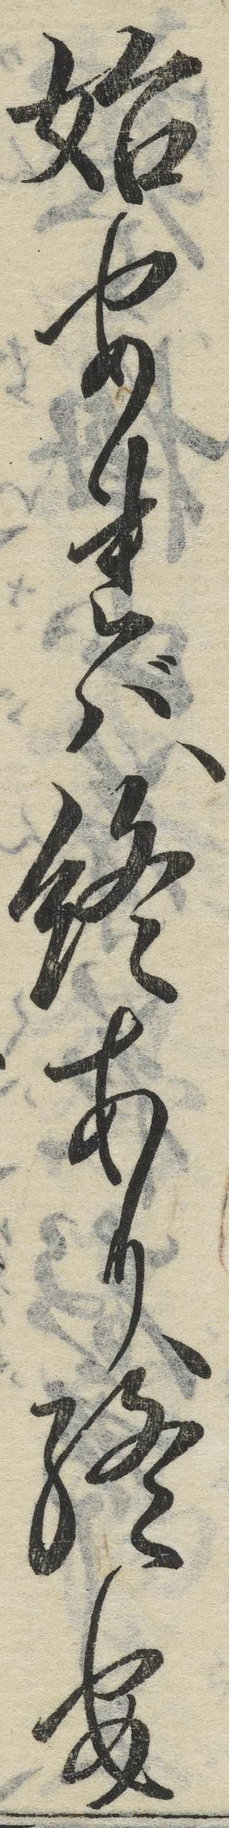始あれば、終あり、終あ
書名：暦日往来　單
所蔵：東京大学地震研究所図書室 Earthquake Research Institute Library, The University of Tokyo, JAPAN
